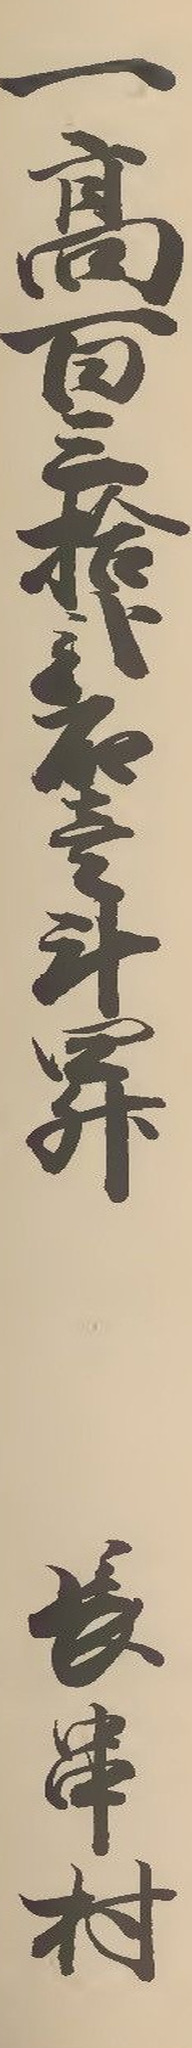一髙百三拾弐石壱斗四升長串村
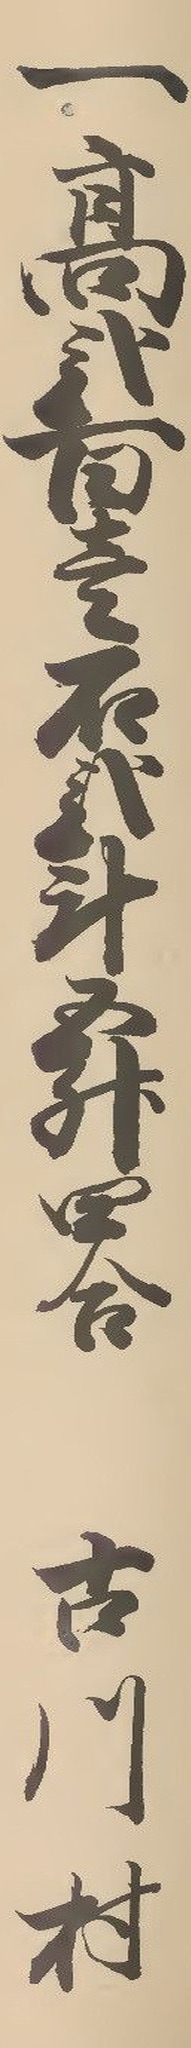一髙弐百壱石弐斗五升四合古川村
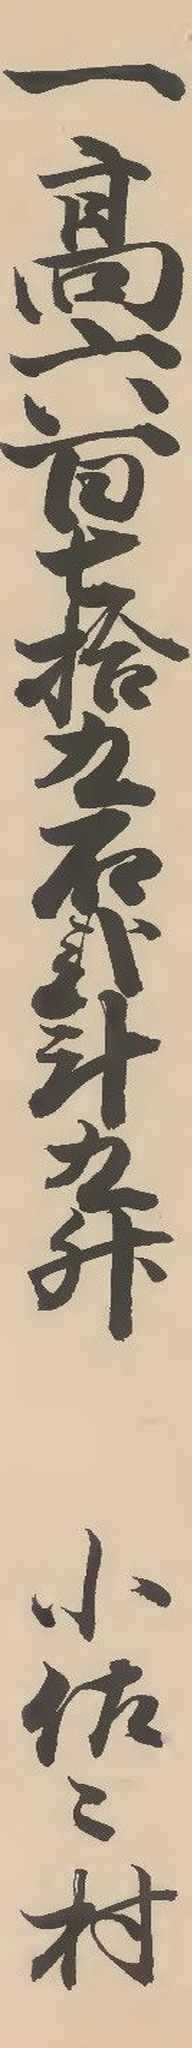一髙六百七拾九石弐斗九升小佐々村
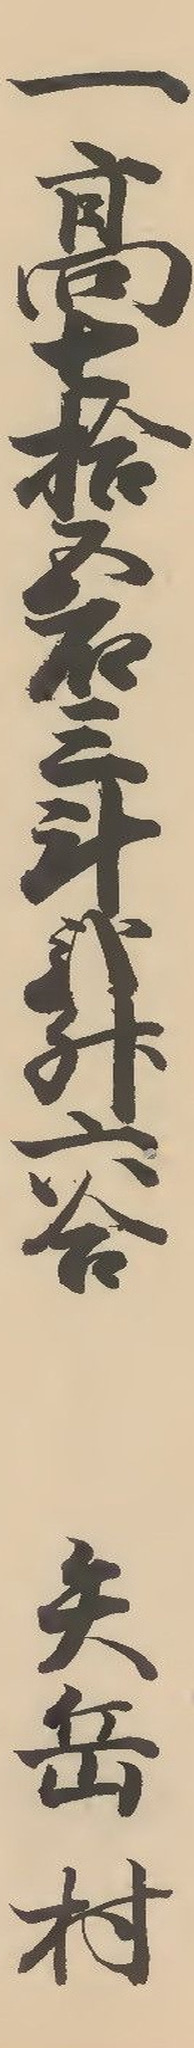一髙七拾五石三斗弐升六合矢岳村
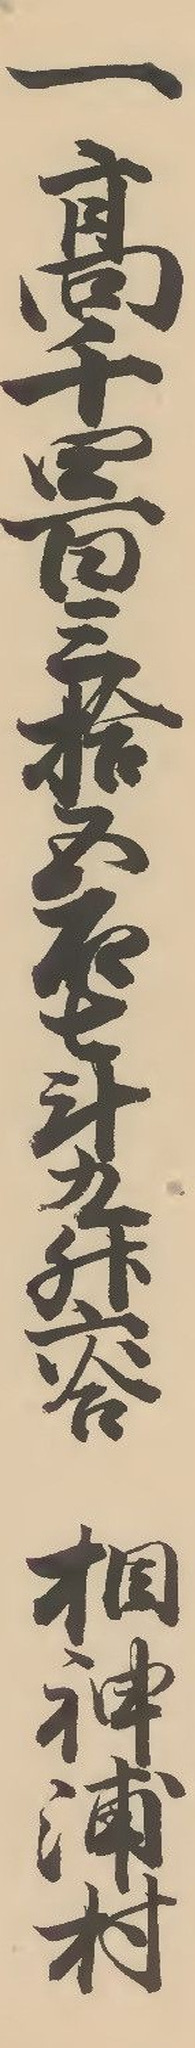一髙千四百三拾五石七斗九升六合相神浦村

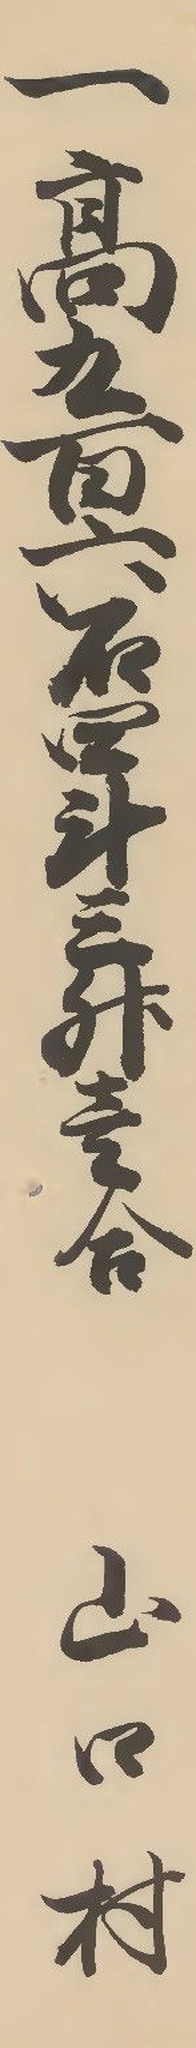一髙九百六石四斗三升壱合山口村
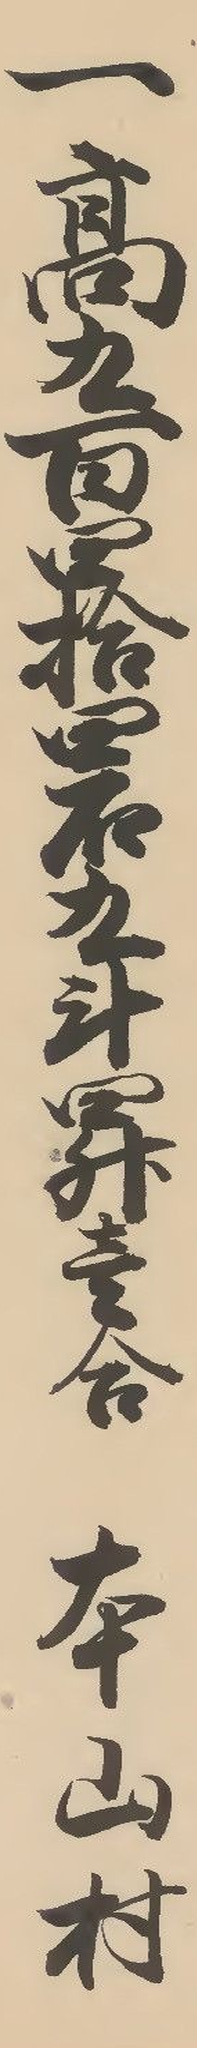一髙九百四拾四石九斗四升壱合本山村
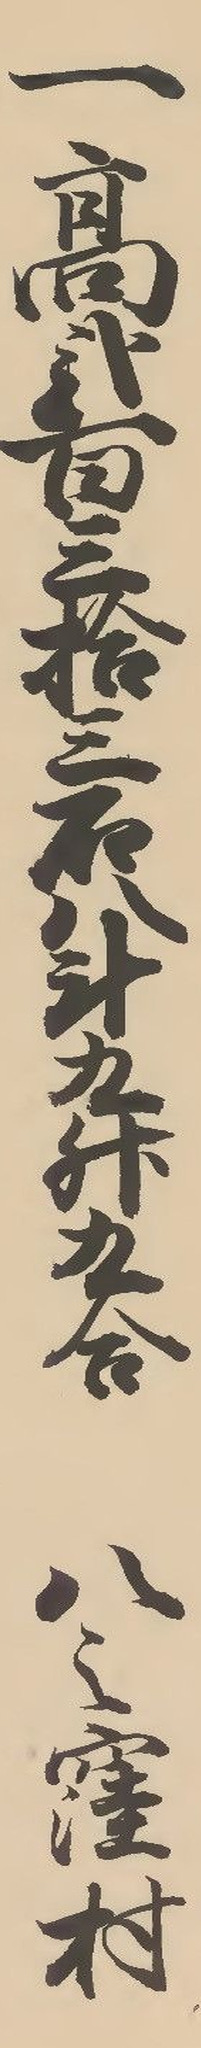一髙弐百三拾三石八斗九升九合八之窪村
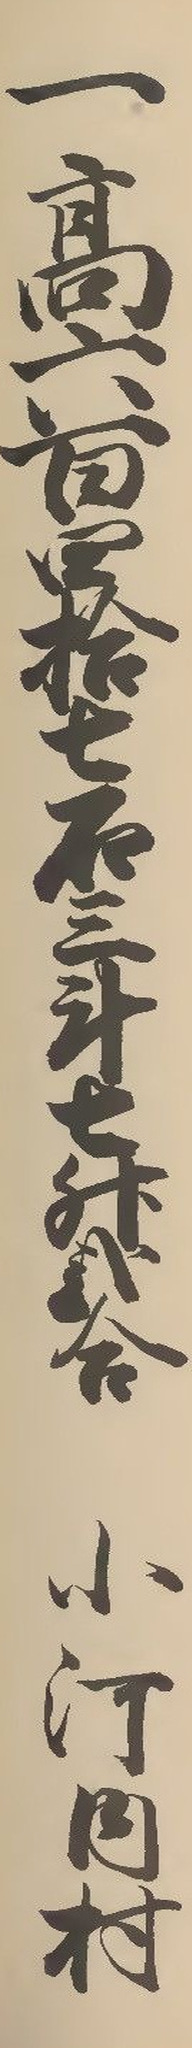一髙六百四拾七石三斗七升弐合小河内村
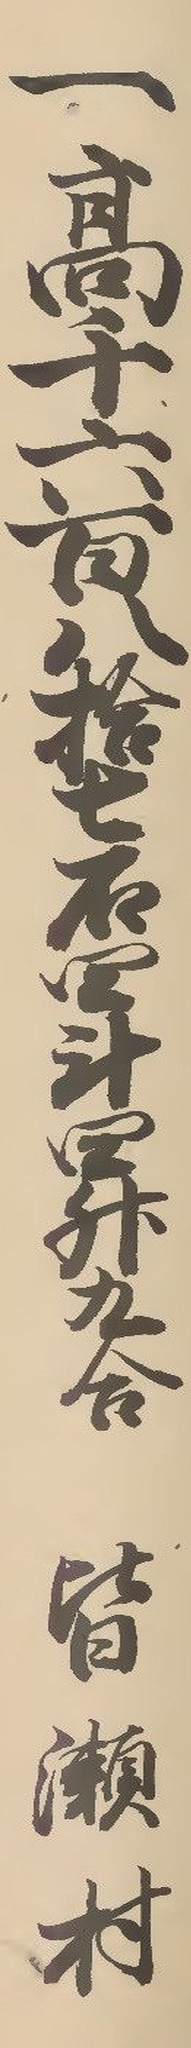一髙千六百八拾七石四斗四升九合皆瀬村
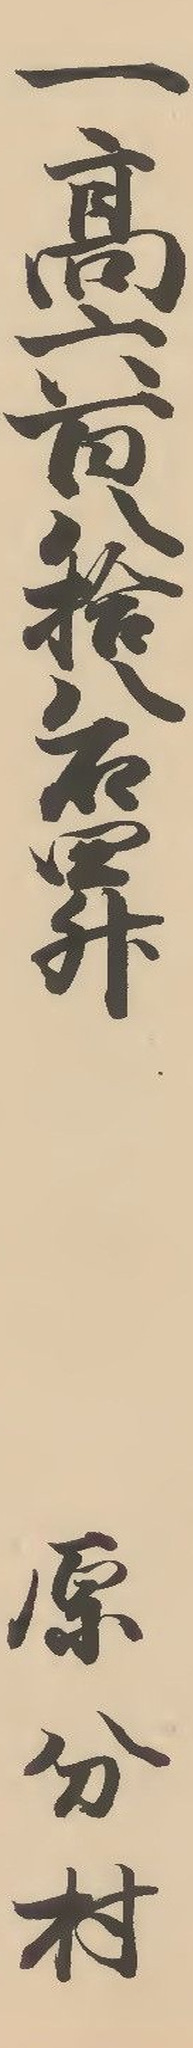一髙六百八拾八石四升原分村
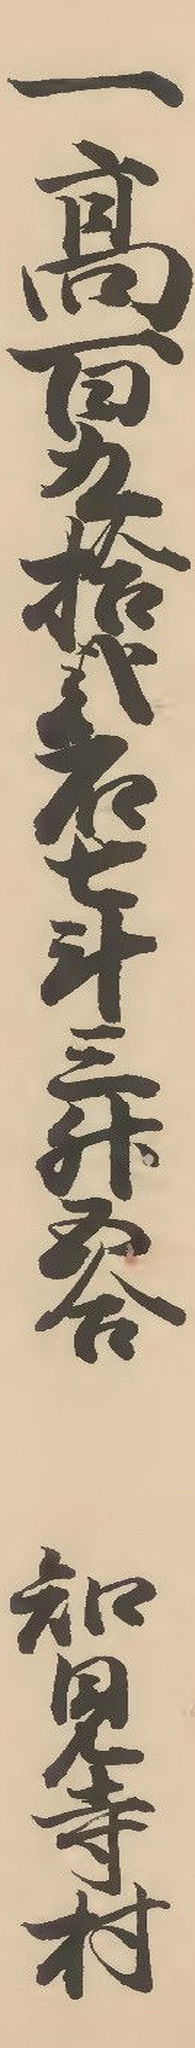一髙百九拾弐石七斗三升五合知見寺
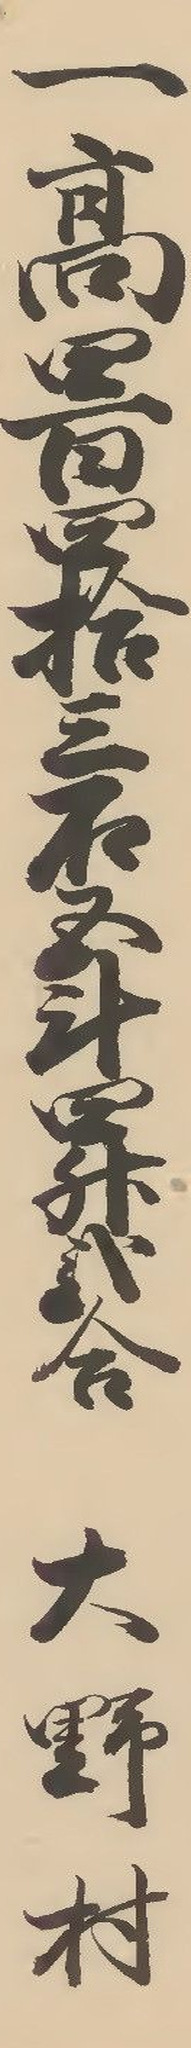一髙四百四拾三石五斗四升弐合大野村

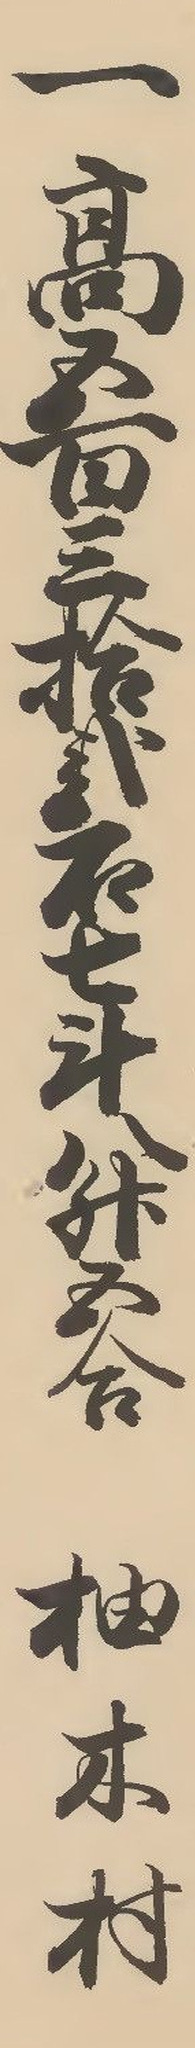一髙五百三拾弐石七斗八升五合柚木村
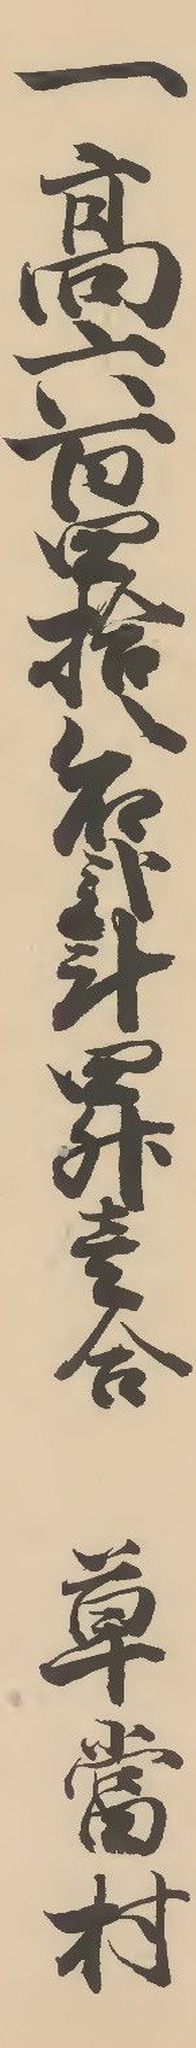一髙六百四拾八石弐斗四升壱合草当村
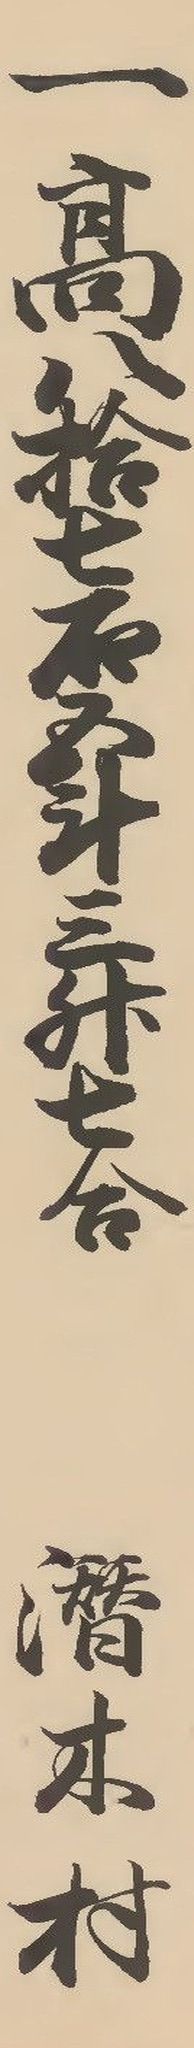一髙八拾七石五斗三升七合潜木村
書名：肥前国郷帳
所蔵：国立公文書館 National Archives of Japan
